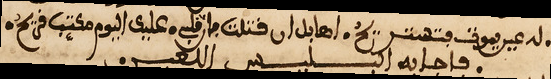له عين يموت فتستريحُ اهابل ان قتلت فانّ قبلى عليك اليوم مكتب قريحُ
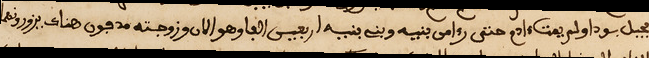بجبل بودا وولم يمت ءادم حتى رءا من بنيه وبني بنيه اربعين الفا وهو الان وزوجته مدفون هناك يزورونهما
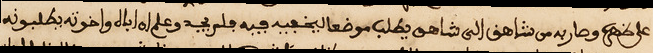على ظهره وصار به من شاهق الى شاهق يطلب موضعا ليخبيه فيه فلم يجد وعلم ان اباه واخوته يطلبونه
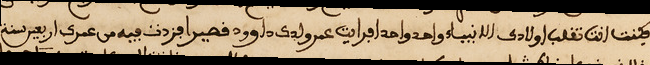فكنت انت تقلب اولاك الانبياء واحد واحدا فرايت عمر ولدك داود قصيرا فزدت فيه من عمرك اربعين سنة
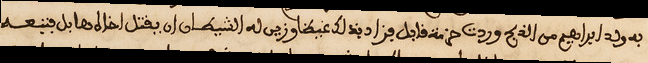به لد ابراهيم من الذبح وردت حزمة قابل فزاد بذلك غيظا وزين له الشيطان ان يقتل اخاه هابل فتبعه
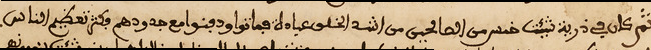ثم كان في ذرية شيئت خمس من الصالحين من اشد الخلق عبادة فماتوا ودفنوا مع جدودهم فكثر تعظيم الناس
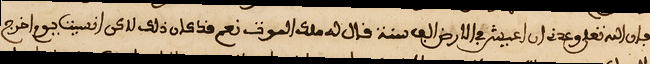فان الله تعلى وعدنى ان اعيش في الارض الف سنة قال له ملك الموت نعم قد كان ذلك لاكن انسيت يوم اخرج
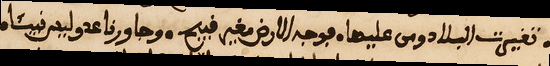تغيرت البلاد ومن عليها فوجه الارض مغي فتح وجاورنا عدو ليس ينئا
